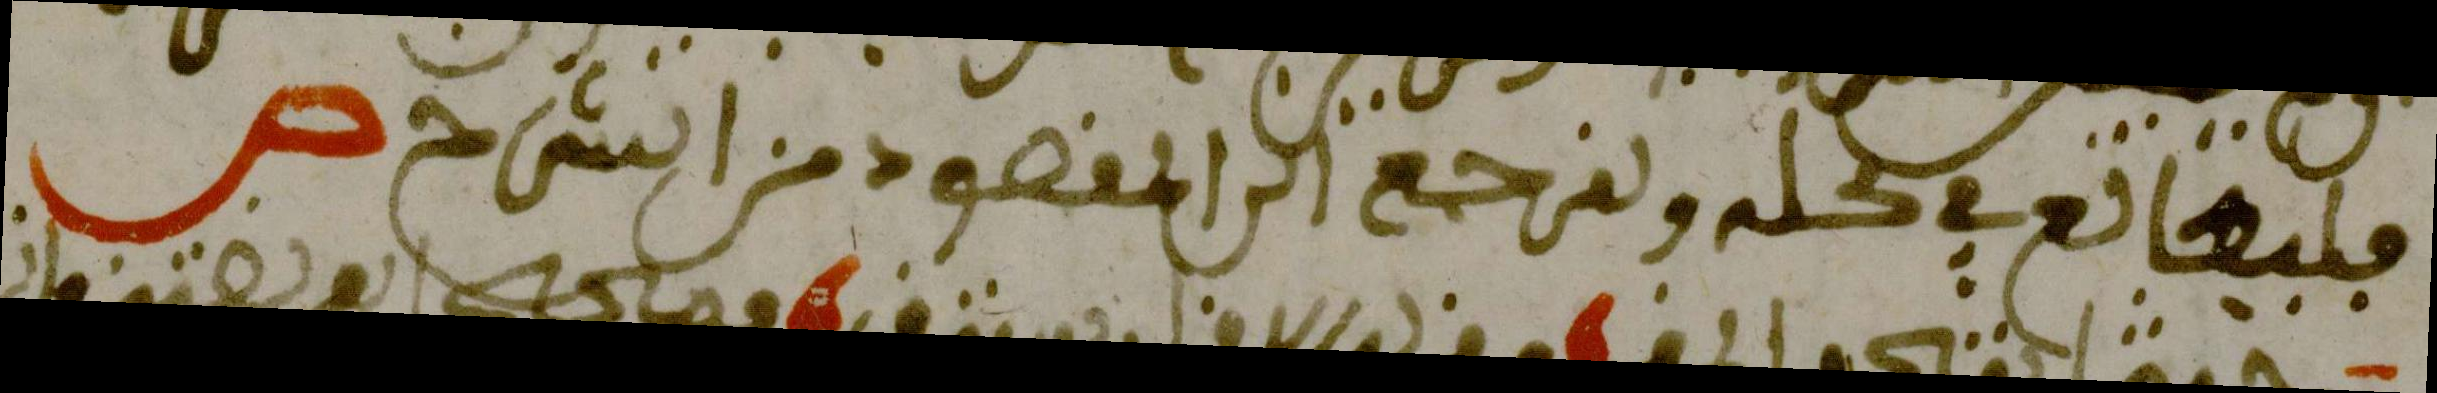فليطالع في محله ولنرجع الى المقصود من الشرح ص
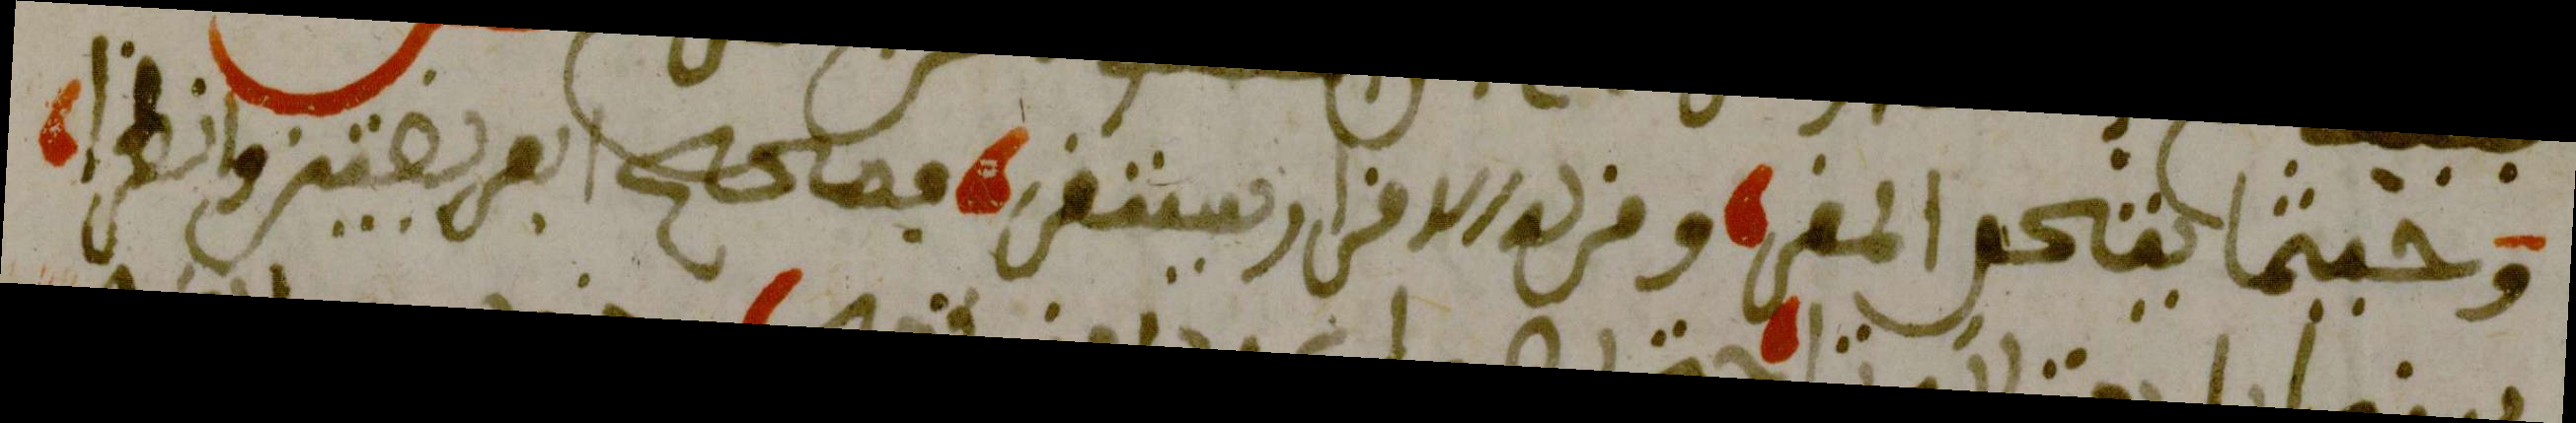وَحيثما يتحد المقر ومن له الاقرار يستقر فصحح الفريضة وانظرا
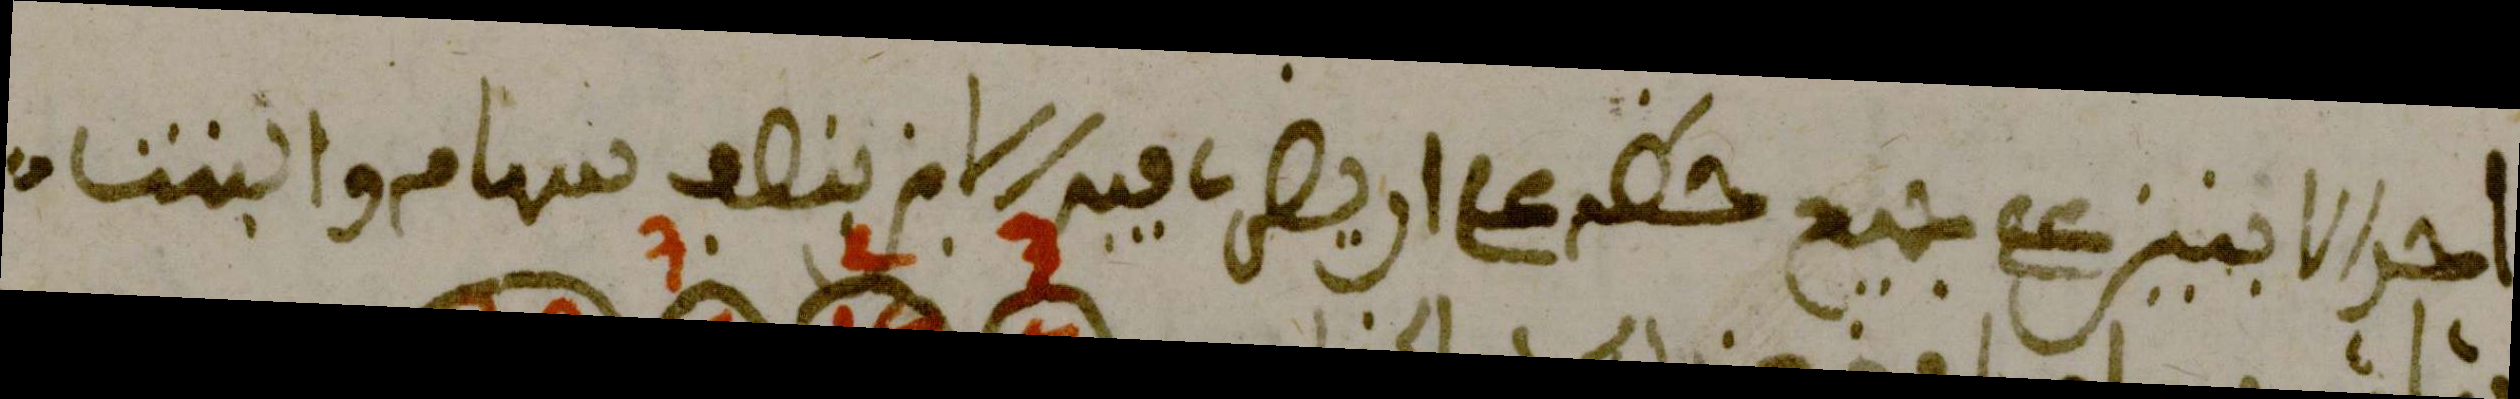احد الابنين على جميع حظه على ان يضرب فيه الابن بنصف سهامه والبنت
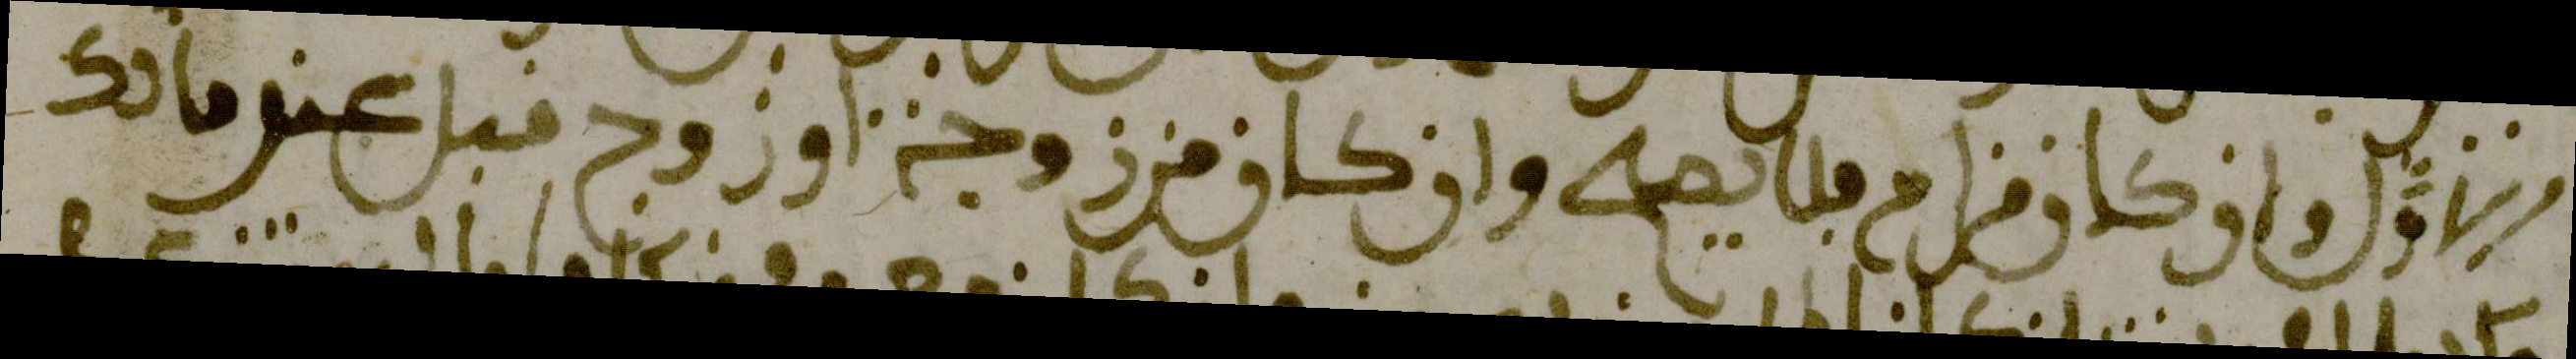الاوّل وان كان من ام فلا يصح وان كان من زوجة او زوج قبل عند مالك
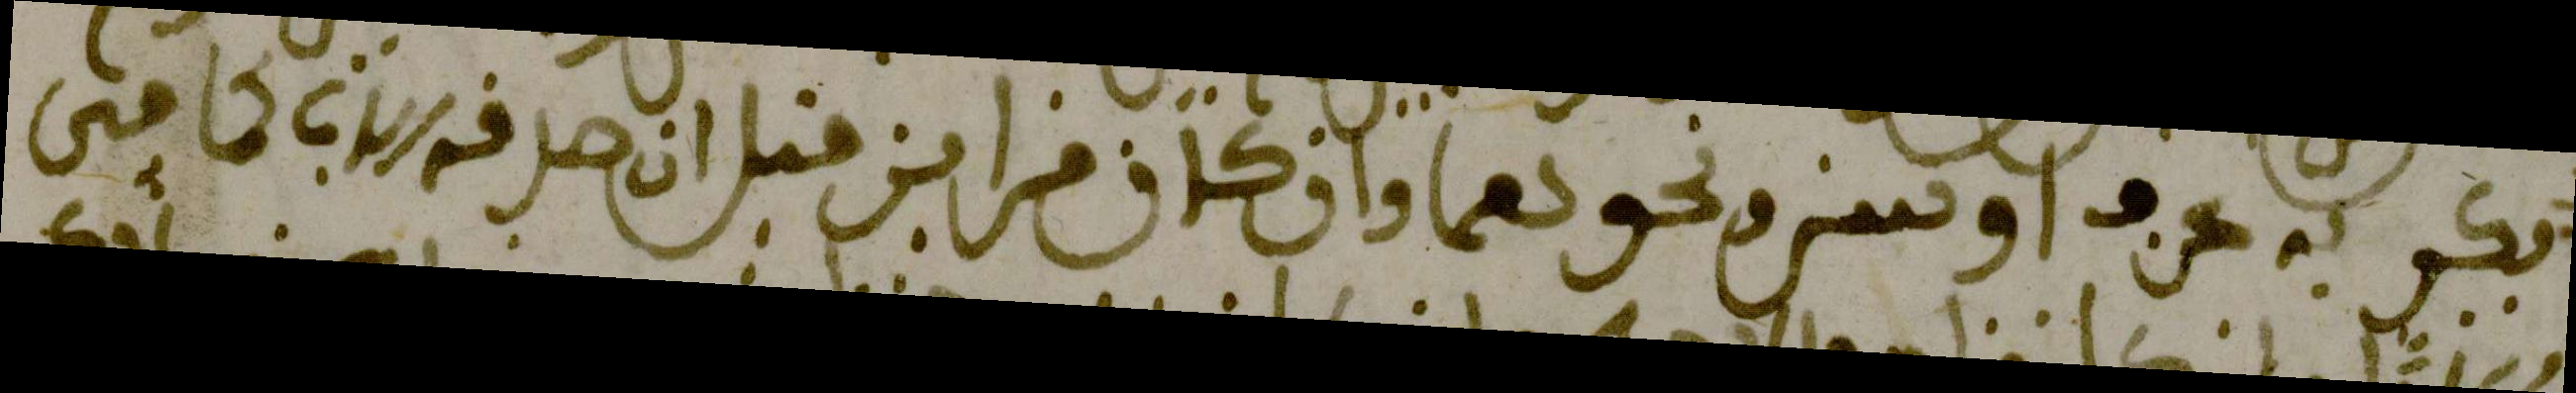يكن له عرف او سن ونحوهما وان كان من ابن قبل ان صدقة الاب كما في
